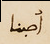اصبنا
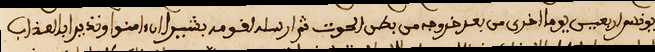يونس اربعين يوما اخرى من بعد خروجه من بطن الحوت ثم ارسله لقومه بشيرا ان ءامنوا ونذيرا بالعذاب
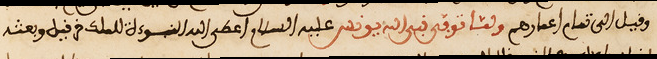وقيل الى تمام أعمارهم ولما توفى نبى الله يونس عليه السلام اعطى الله النبوءة للملك حزقيل وبعثه
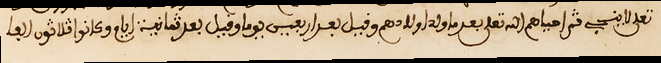تعلى لا ينجى ثم احياهم الله تعلى بعدما ولدا ولادهم وقيل بعد اربعين يوما وقيل بعد ثمانية ايام وكانوا ثلاثون الفا
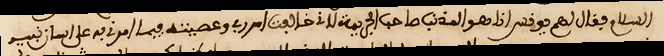السلام فقال لهم يونس انا هو المذنب صاحب الجريمة لانى خالفت امر ربي عصيته فيما امرنى به على اسان نبيه
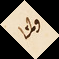ولما
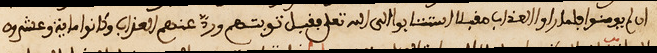ان لم يومنوا فلما راوا العذاب مقبلا استتابوا الى الله تعلى فقبل توبتهم وردّ عنهم العذاب وكانوا ماية وعشرون
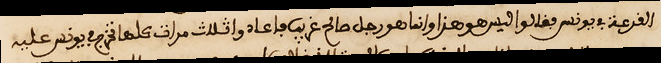القرعة في يونس فقالوا ليس هو هذا وانما هو رجل صالح غريب فاعاد واثلاث مرات كلها تخرج في يونس عليه
